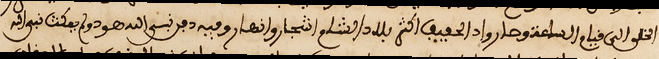الخلق الى قيام الساعة وصار واد الحقيق اكثر بلاد الشام أشجار وانهار وفيه دفن نبى الله هود ولم يمكث نبى الله
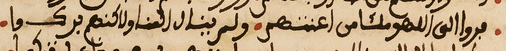فروا الى اللهو مئامن اعنتهم ولم ينال المنا ولاكنهم بركوا
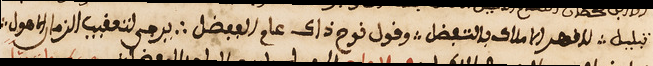تبليل لاقهر الاملاك بالتفضل وقول نوح ذاك عام الففضل يرجى لتعقيب الزمان الاهول
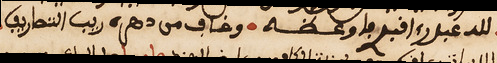لله عبد رءا قبره فاوعظه وخاف من دهره ريب التصاريف
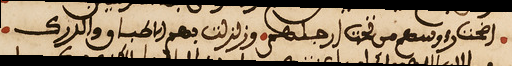اضحت رءوسهم من تحت ارجلهم وزلزلت بهم الاطباق والدرك
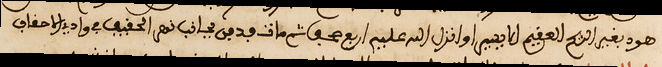هود بغير الريح العقيم الا يسيرا و انزل الله عليه اربع صحف ثم مات فدفن بجانب نهر الحقيق في واد في الاحقاف
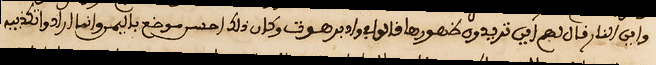واين النار قال لهم اين تريدون ظهورها قالوا في واد برهوت وكان ذلك حسن موضع باليمن وانما ارادوا تكذيبه
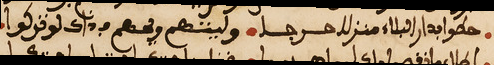حطوا بدار البلاء منزلا حرجا وليتهم يحهم في ذاك لو تركوا
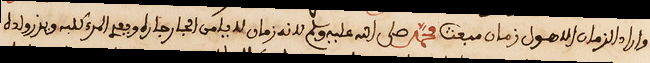واراد الزمان الاهول زمان مبعث محمد صلى الله عليه وسلم لانه زمان لايا من الجار جاره يفرى المرء كلبه ويزر ولده
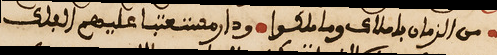من الزمان باملاك وما ملكوا دار مستعتبا عليهم الفلك
